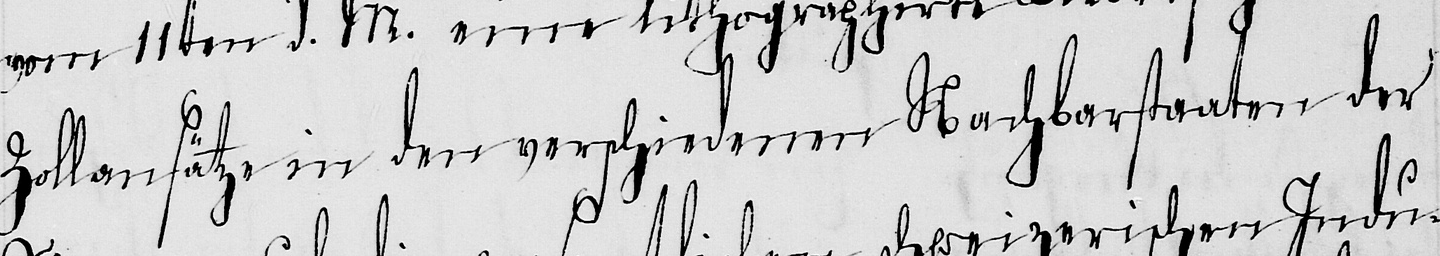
Zollansätze in den verschiedenen Nachbarstaaten der
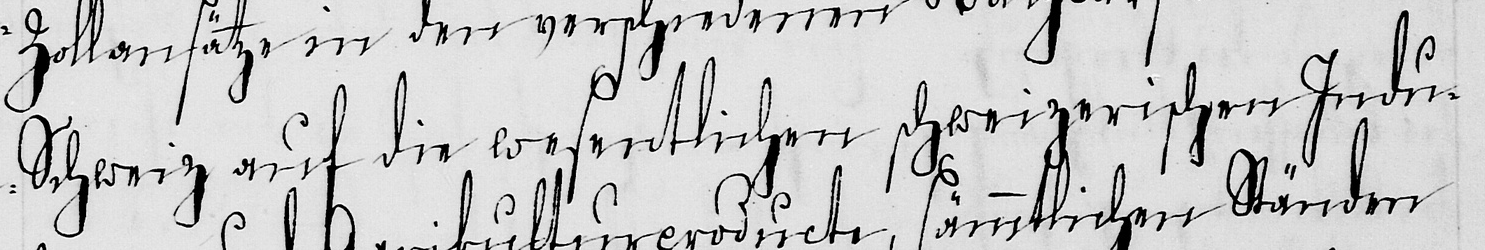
Schweiz auf die wesentlichen schweizerischen Indu¬
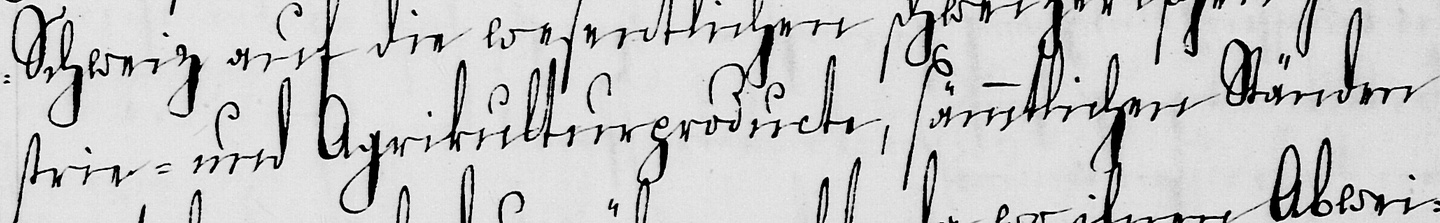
strie- und Agrikulturproducte, sämmtlichen Ständen
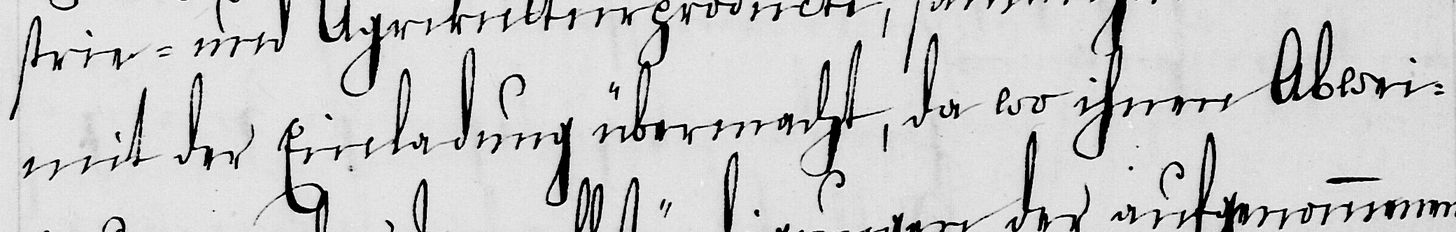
mit der Einladung übermacht, da wo ihnen Abwei¬
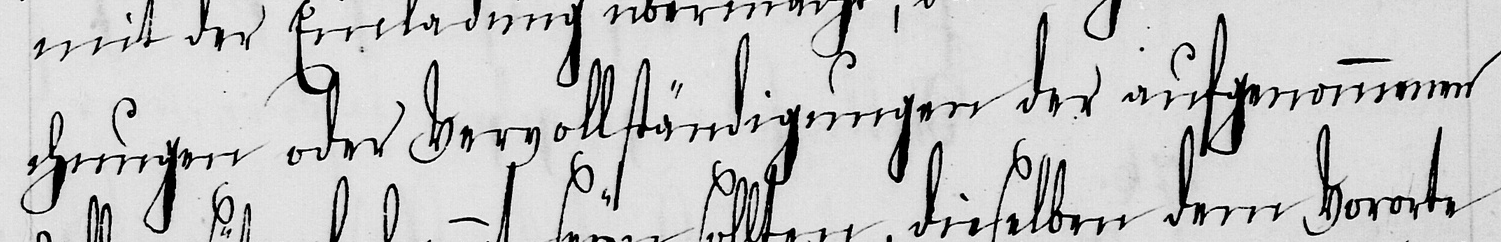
chungen oder Vervollständigungen der aufgenommenen
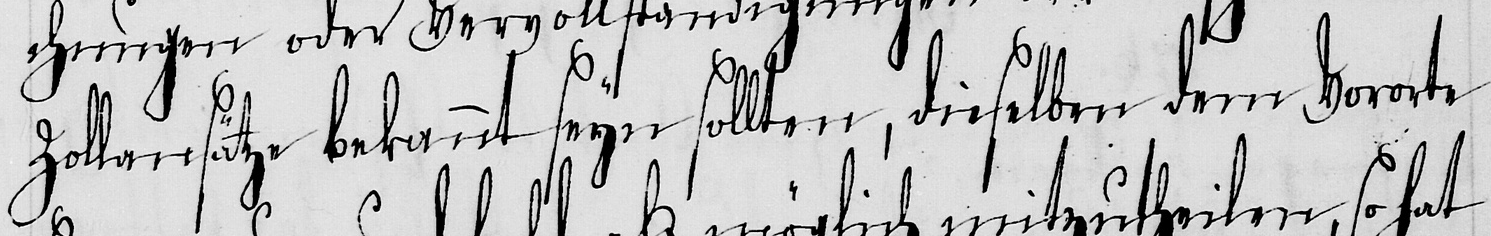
Zollansätze bekannt seyn sollten, dieselben dem Vororte
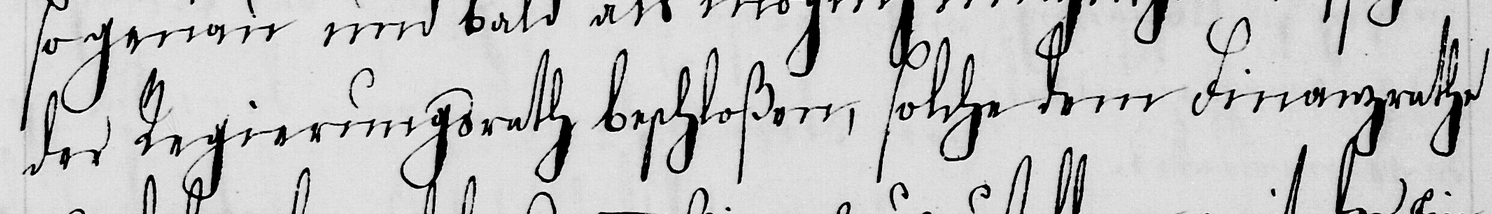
der Regierungsrath beschloßen, solche dem Finanzrathe
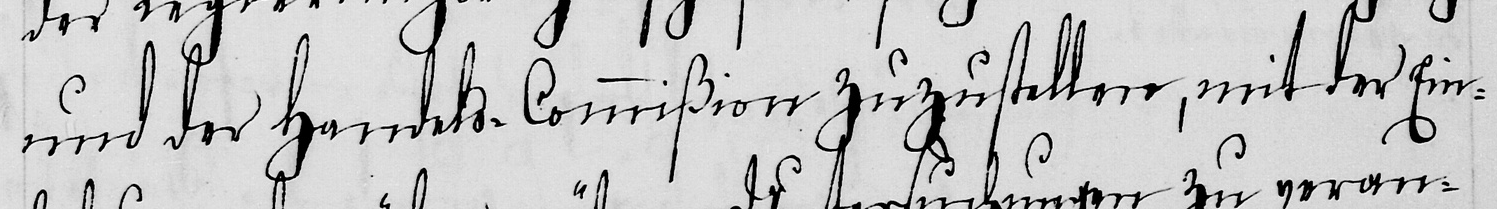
und der Handels-Commißion zuzustellen, mit der Ein¬
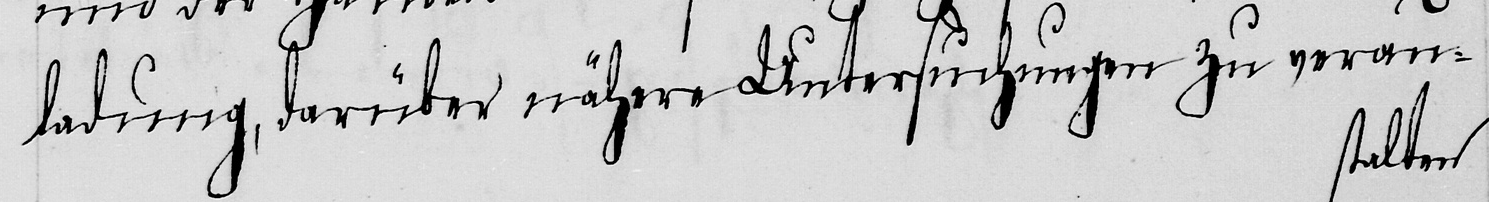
ladung, darüber nähere Untersuchungen zu veran-
